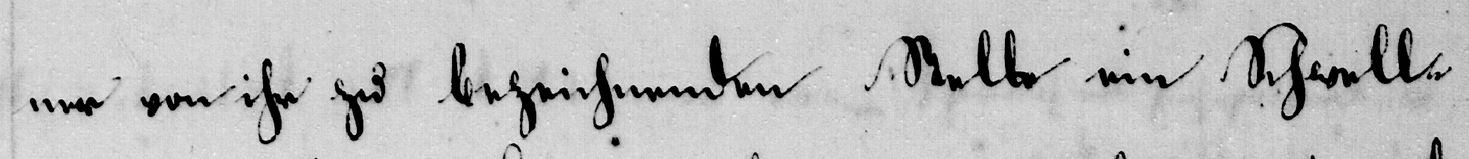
ner von ihr zu bezeichnenden Stelle ein Schwell¬
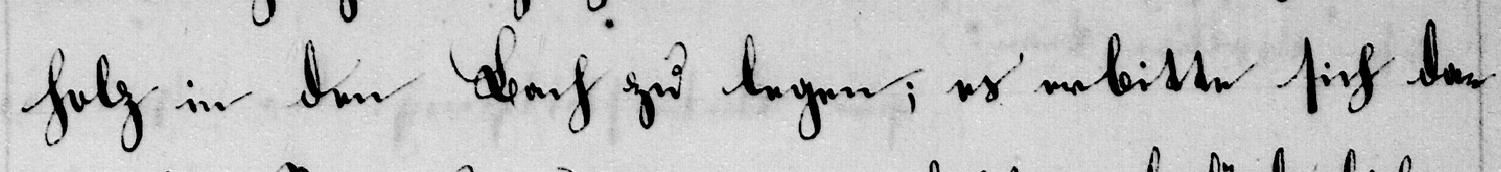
holz in den Bach zu legen; es erbitte sich da¬
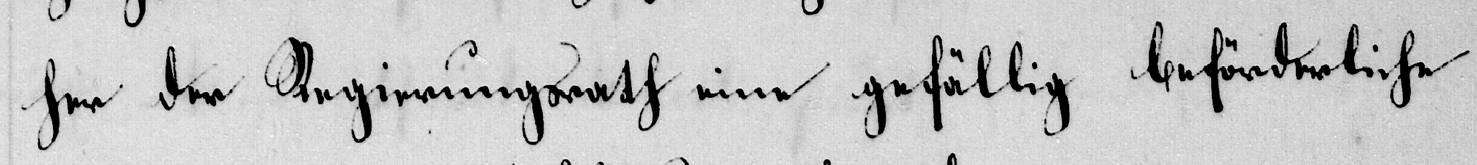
her der Regierungsrath eine gefällig beförderliche
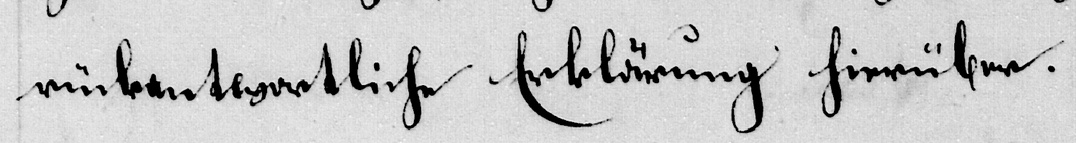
rückantwortliche Erklärung hierüber.
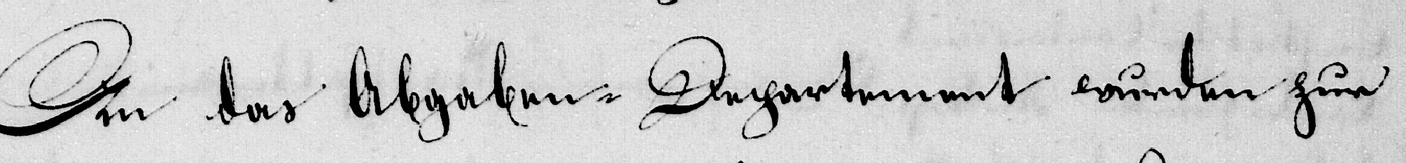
An das Abgaben-Departement wurden zur
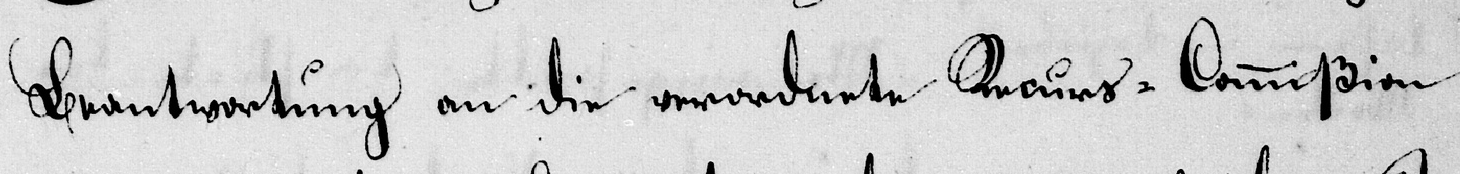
Beantwortung an die verordnete Recurs-Commißion
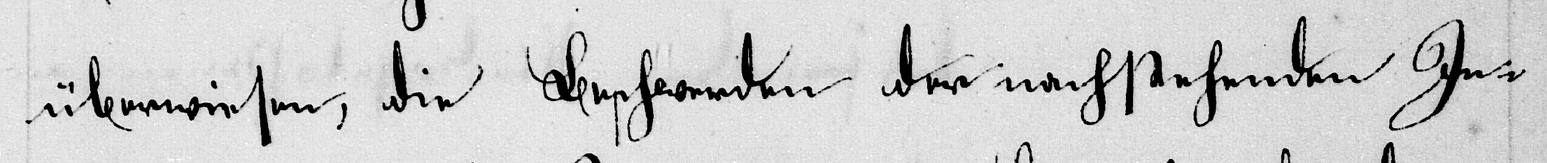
überwiesen, die Beschwerden der nachstehenden In¬
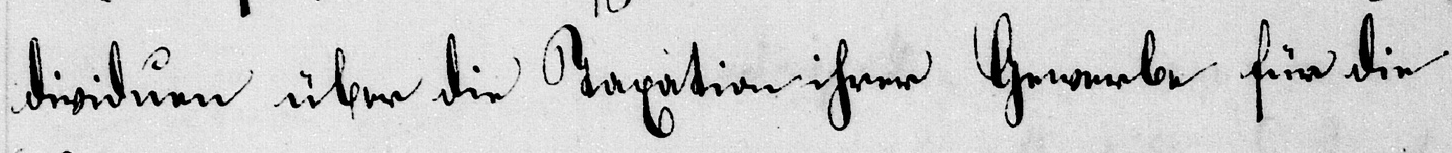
dividuen über die Taxation ihrer Gewerbe für die
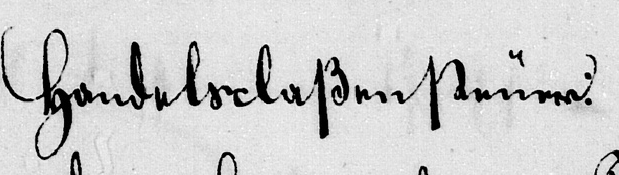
Handelsclaßensteuer.
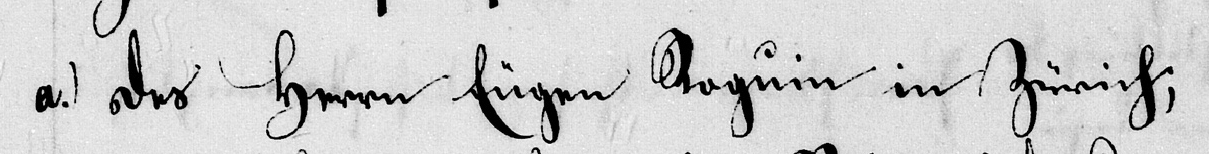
a.) des Herrn Eugen Roguin in Zürich,
